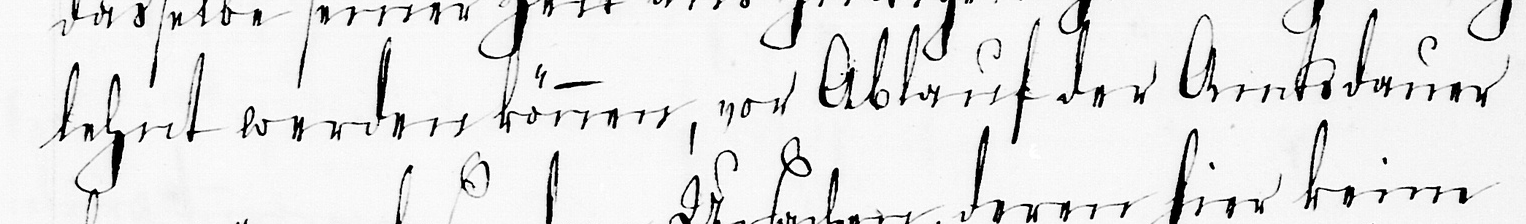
lehnt werden können, vor Ablauf ist der Amtsdauer
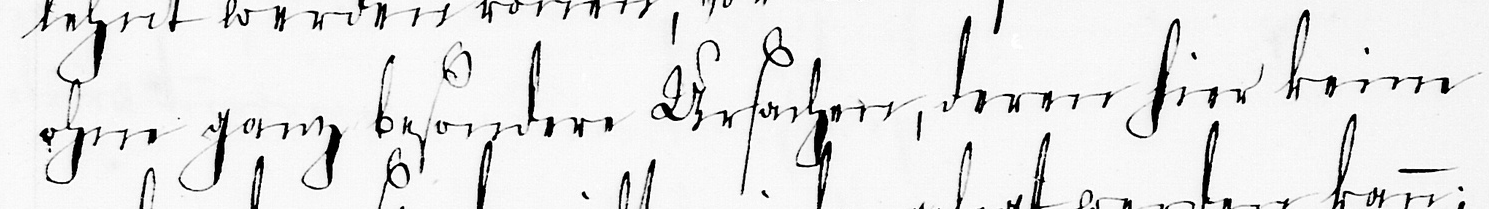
ohne ganz besondere Ursachen, deren hier keine
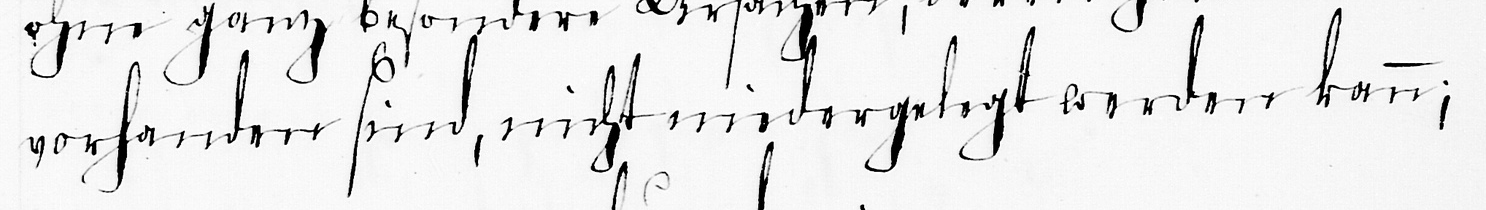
vorhanden sind, nicht niedergelegt werden kann;
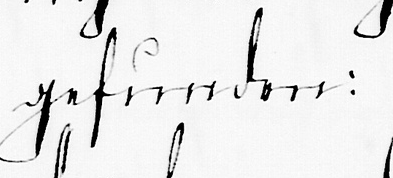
gefunden:
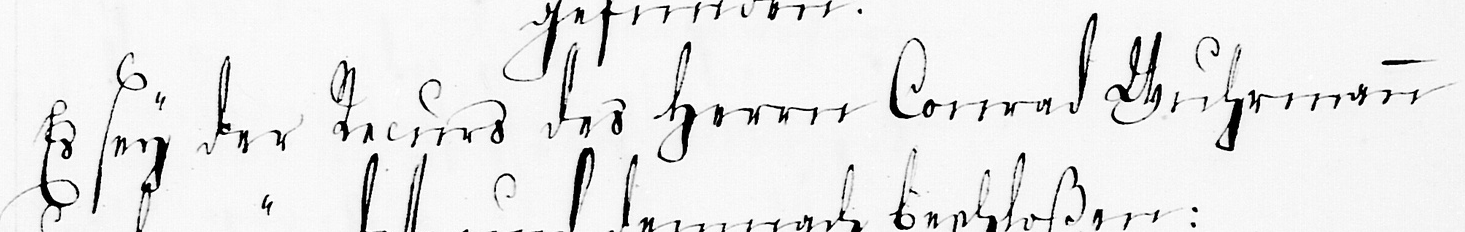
Es sey der Recurs des Herrn Conrad Wuhrmann
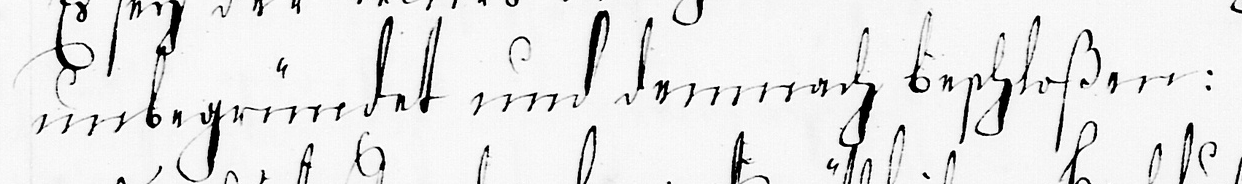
unbegründet und demnach beschloßen:
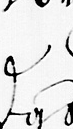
2.)
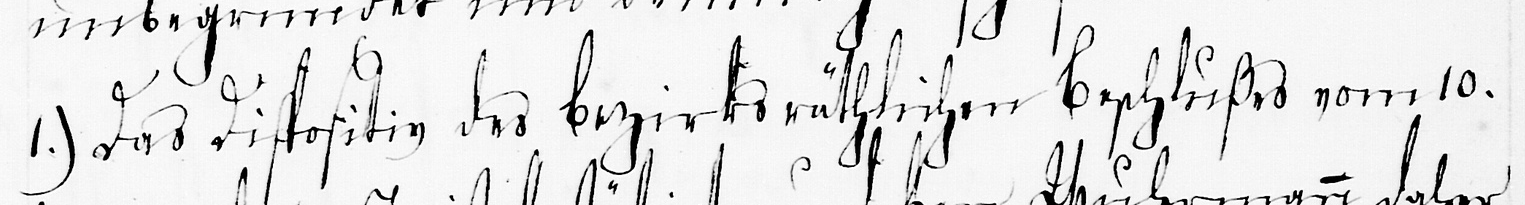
1.) Das Dispositiv des bezirksräthlichen Beschlußes vom 10.
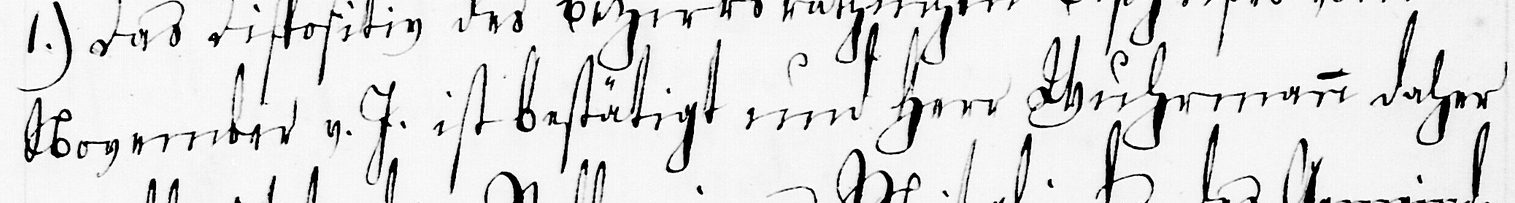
November v. J. ist bestätigt und Herr Wuhrmann daher
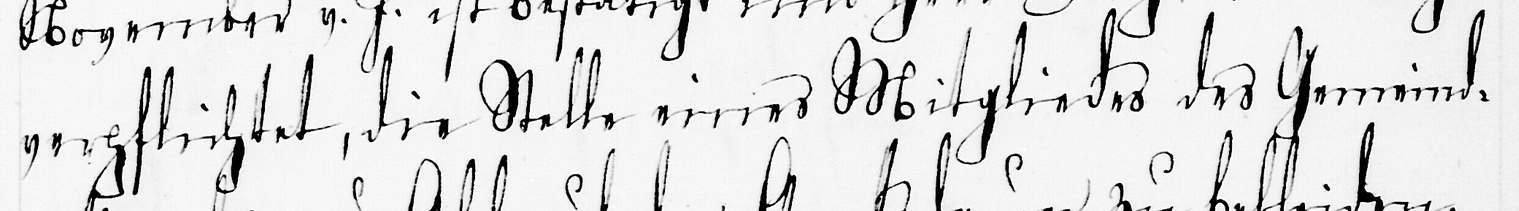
verpflichtet, die Stelle eines Mitgliedes des Gemeinde¬
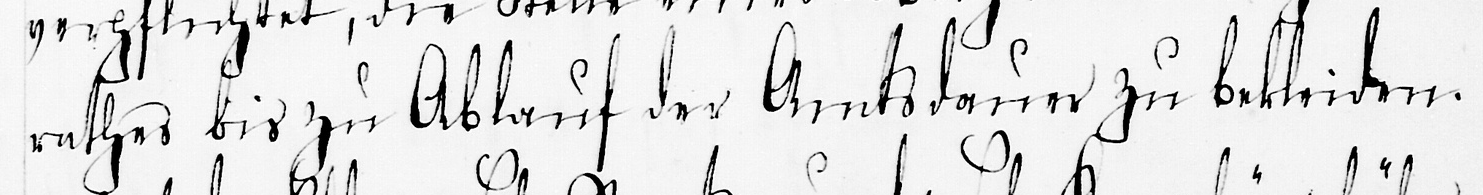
rathes bis zu Ablauf der Amtsdauer zu bekleiden.
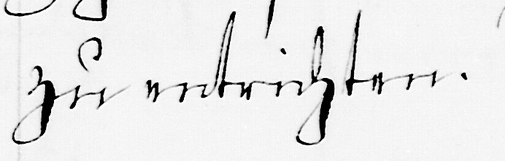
zu entrichten.
